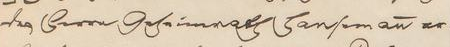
des Herrn Geheimrath Hansemann er-
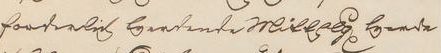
forderlich werdende Mitthlungen werde
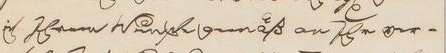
ich Ihrem Wunsche gemäß an Ihr ver-
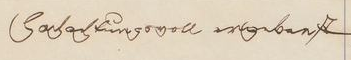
Hochachtungsvoll ergebenst
